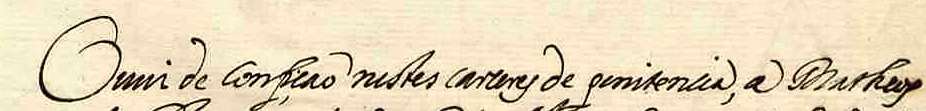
Ouui de confiçaõ nestes carceres de penitencia, a Matheos
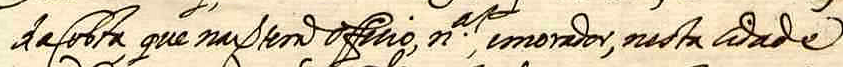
da Costa, que naõ tem officio, n.al, e morador, nesta Cidade
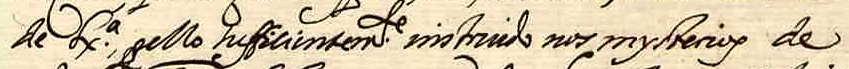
de Lx.a, pello sufficientem.te instruido nos mysterios de
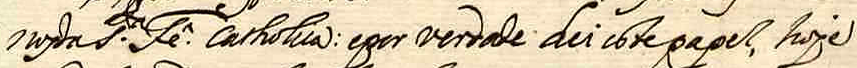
nossa s.ta Fê. Catholica: e per verdade dei este papel, hoje
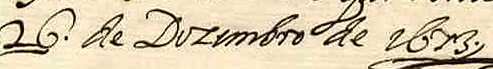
26 de Dezembro de 1673.
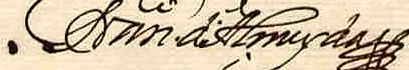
Fran.co d.e Almeyda
